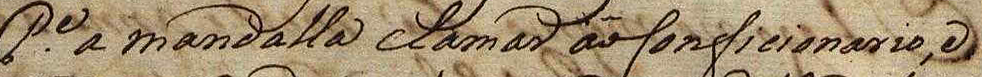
P.e a mandalla chamar ao Conficionario, e
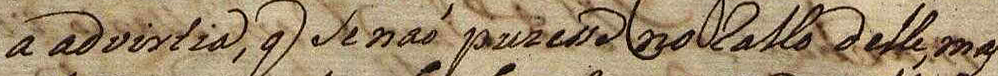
a advirtia, q̄ senaõ puzesse no Rallo delle, mas
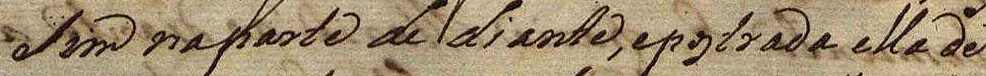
Sim na parte de diante, e postrada ella de
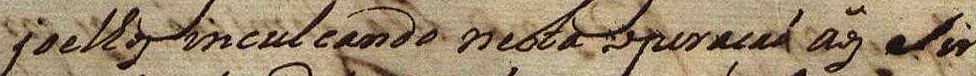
joelhos inculcando nesta operaçaõ aôs Sir
